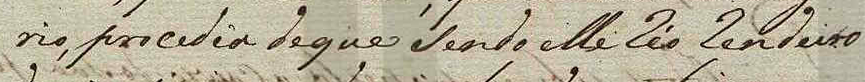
rio, procedia de que sendo elle Réo Rendeiro
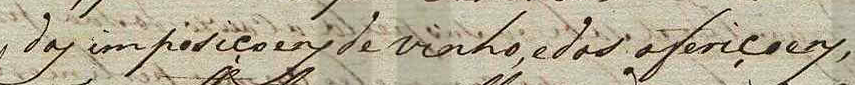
das imposiçoens de vinho, e das aferiçoens,
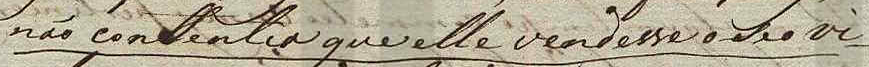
naõ conssentia que elle vendesse o seo vi
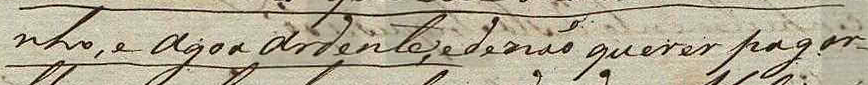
nho, e agoa ardente, e de naõ querer pagar
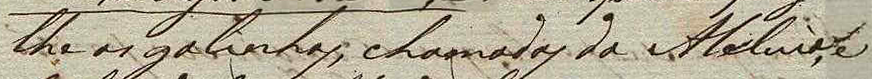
lhe as galinhas, chamadas da Aleluia, e
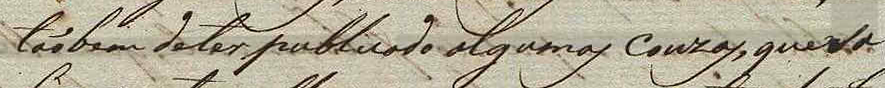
taõbem de ter publicado algumas couzas, que sa
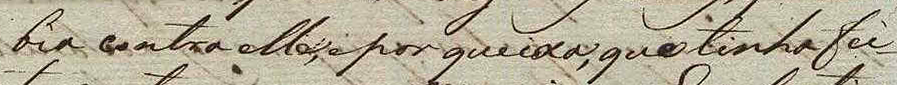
bia contra elle; e por queixa, que tinha fei
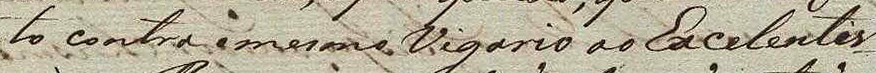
to contra o mesmo Vigario ao Excelentis
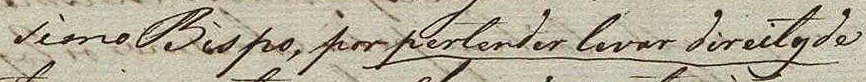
simo Bispo, por pertender levar direitos de
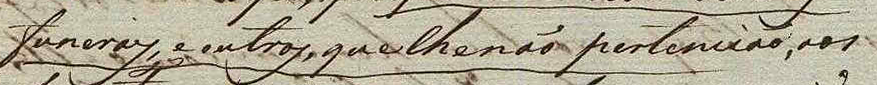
funerais, e outros, que lhe não pertenciaõ, aos
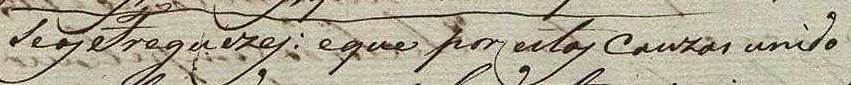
seos Freguezes: e que por estas cauzas unido
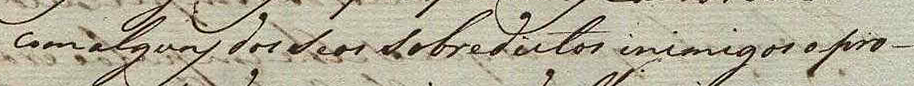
com alguns dos seos sobredictos inimigos o pro
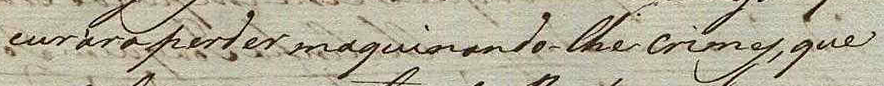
curara perder maquinando-lhe crimes, que
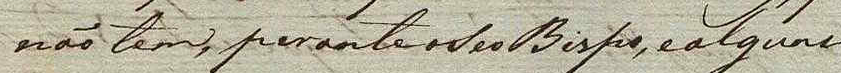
naõ tem, perante o Seo Bispo, e alguns
